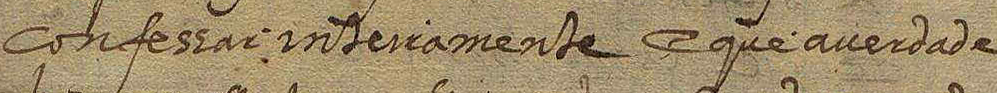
confessar inteiramente e que a uerdade
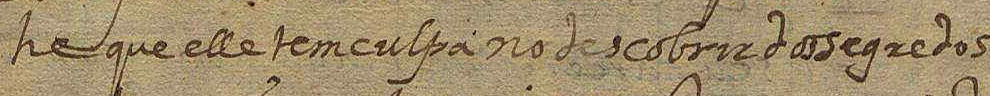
he que elle tem culpa no descobrir dos segredos
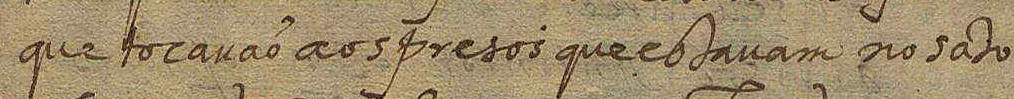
que tocauaõ aos presos que estauam no sāto
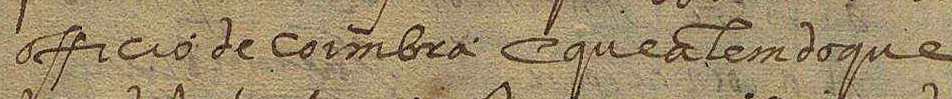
officio de coimbra e que alem do que
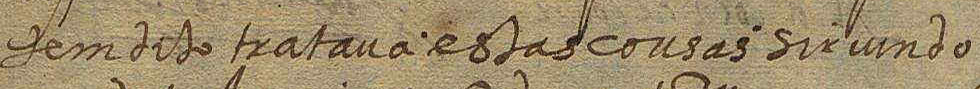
tem dito trataua estas cousas siruindo
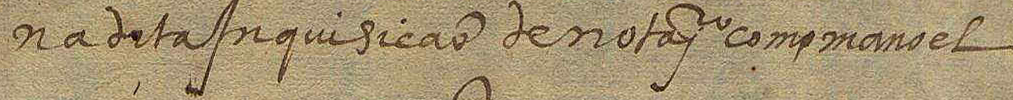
na dita Jnquisiçaõ de notajro como manoeL
